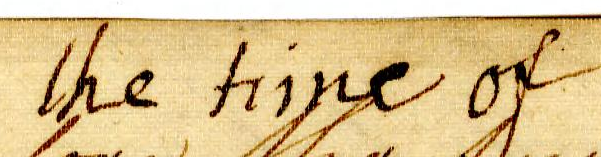the time of
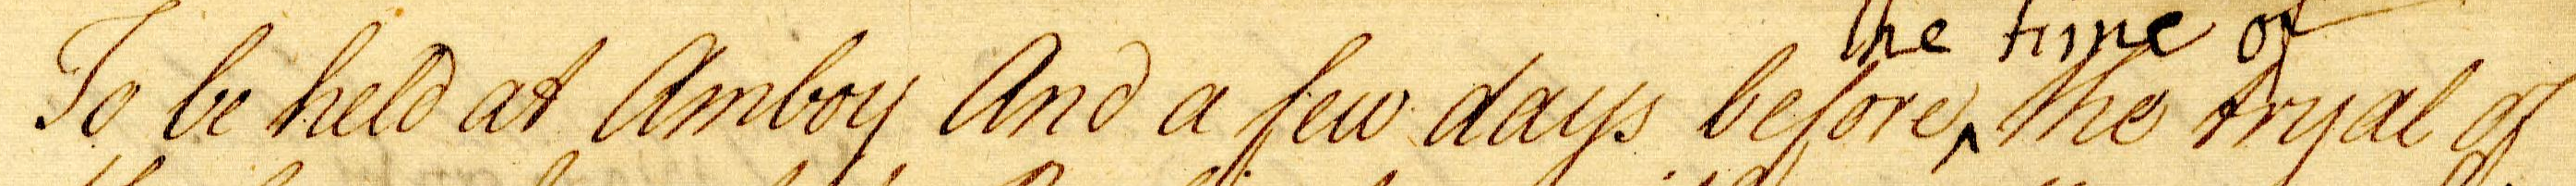To be held at Amboy And a few days before^ the tryal of
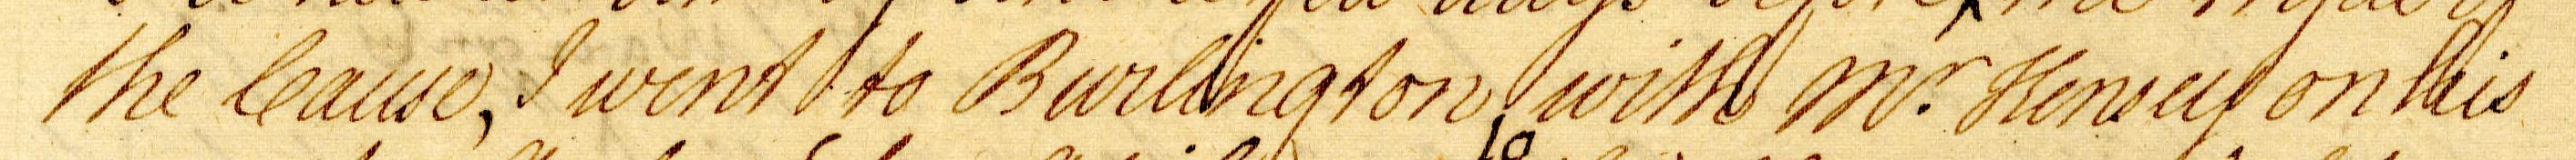the Cause, I went to Burlington with M^r. Kensey on his
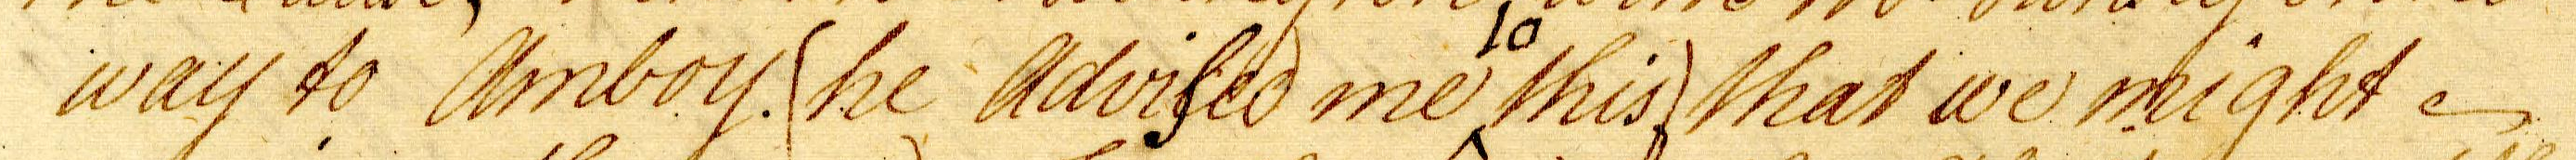way to Amboy. (he Advised me this) that we might-
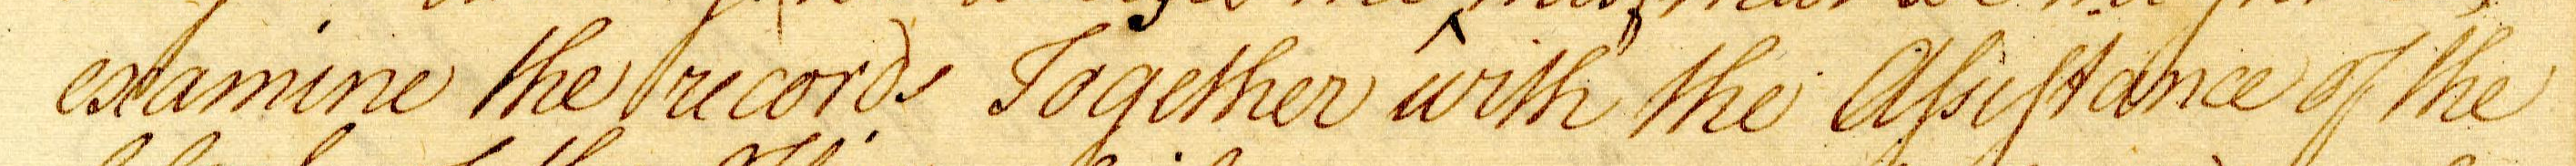examine the records Together with the Assistance of the
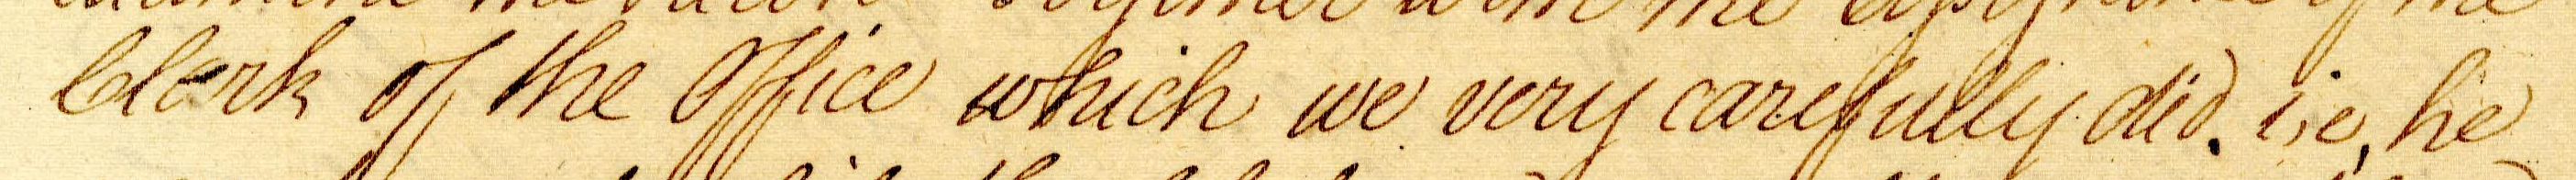Clerk of the Office which we very carefully did. ie, he
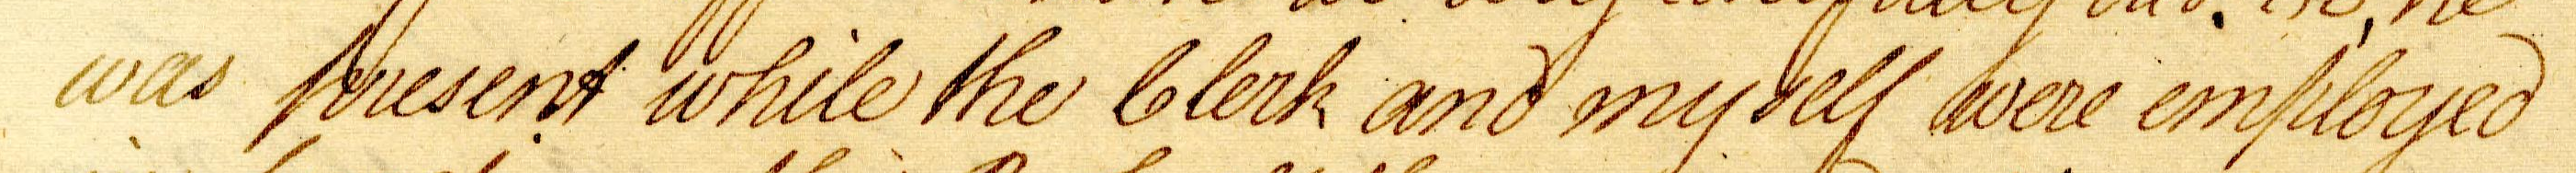was present while the Clerk and myself were employed
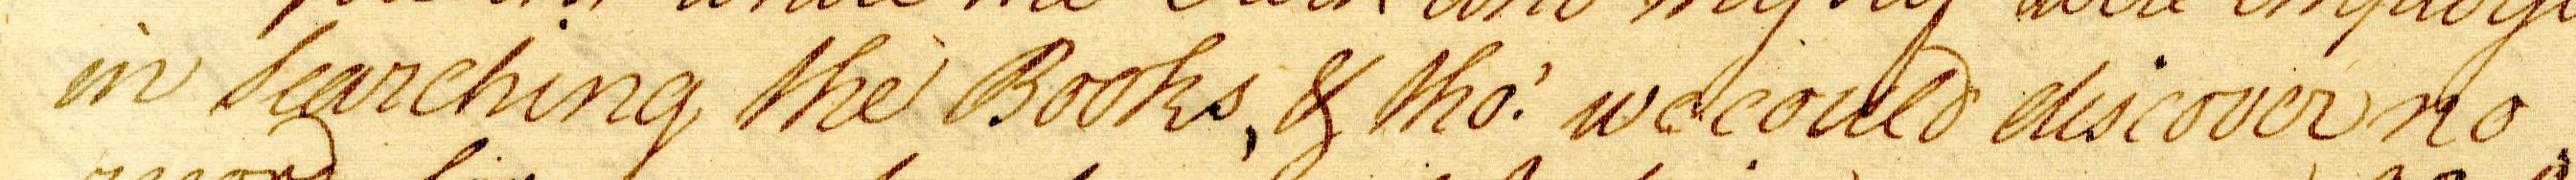in searching the Books, & tho.' we could discover no
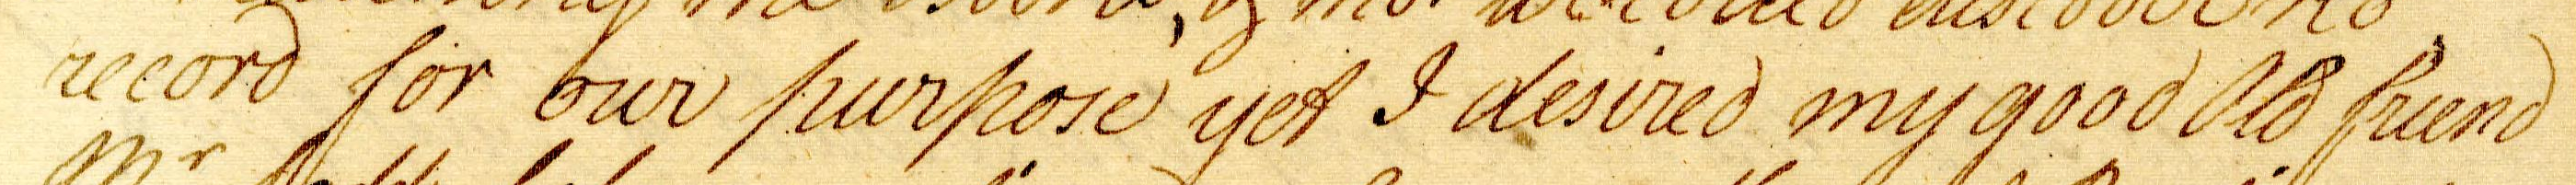record for our purpose yet I desired my good Old friend
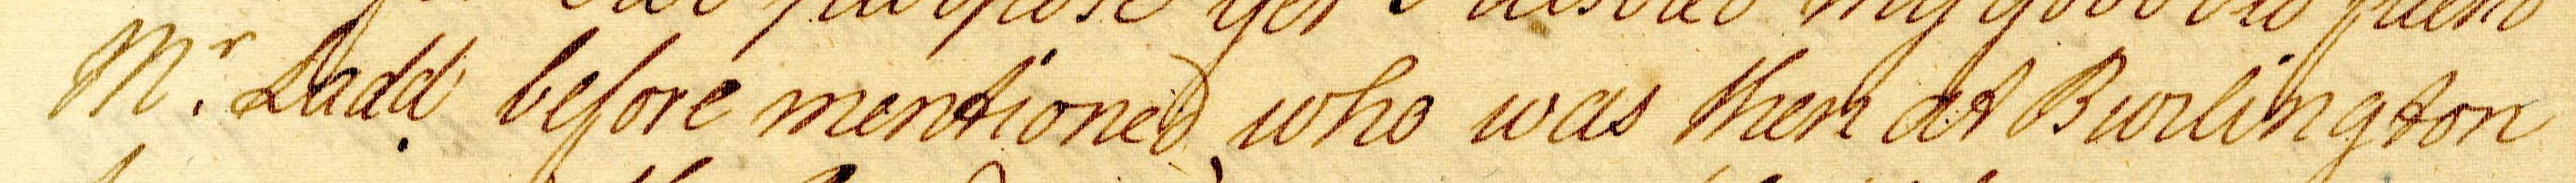M^r. Ladd before mentioned, who was then at Burlington
